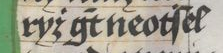ryż ḡt neotẛel
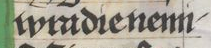wradienemi¬
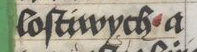loſtiwych.a
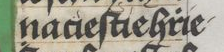na cieſtie hṙie¬
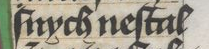ſnych neſtal
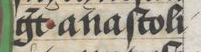ḡt.a na ſtoli¬
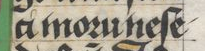ci mozu neſe¬
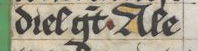diel ḡt. Ale
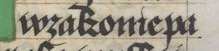wzakonie pa¬
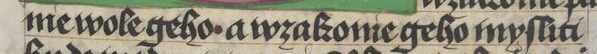nie wole geho.a wzakonie geho myſliti
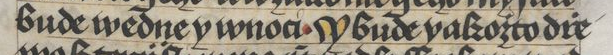bude wedne y wnoci.Y bude yakożto dṙe¬
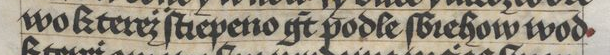wo kterež ẛtiepeno ḡt podle ſbiehow wod
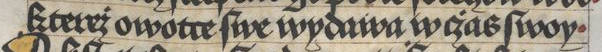kterež owotce ſwe wydawa w cżas ſwoy.
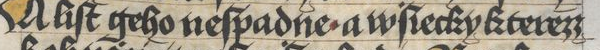A liſt geho neſpadne.a wẛiecky kterezz¬
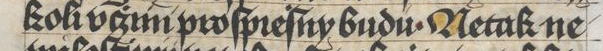koli ucżiní proſpieẛny budu.Netak ne¬
